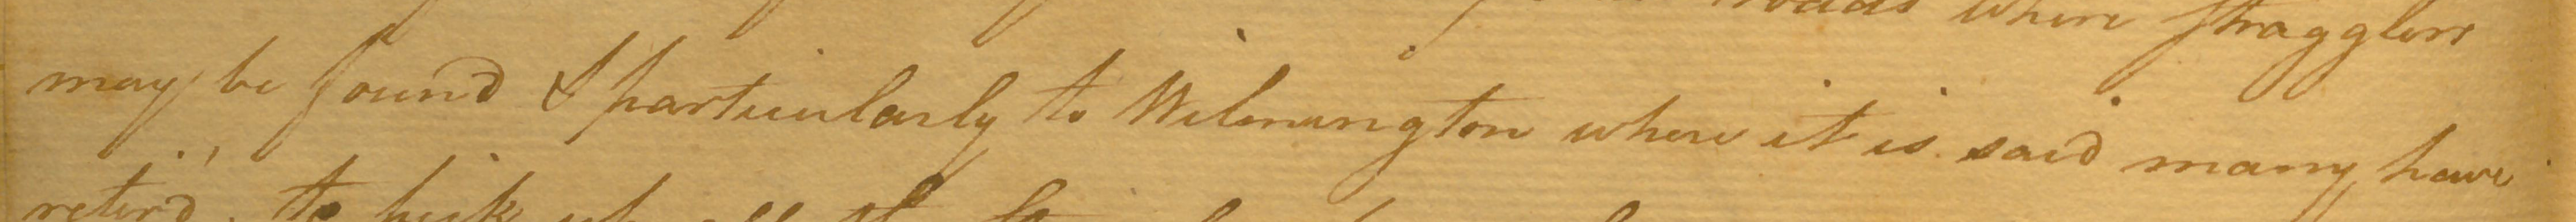may be found & particularly to Wilmington where it is said many have
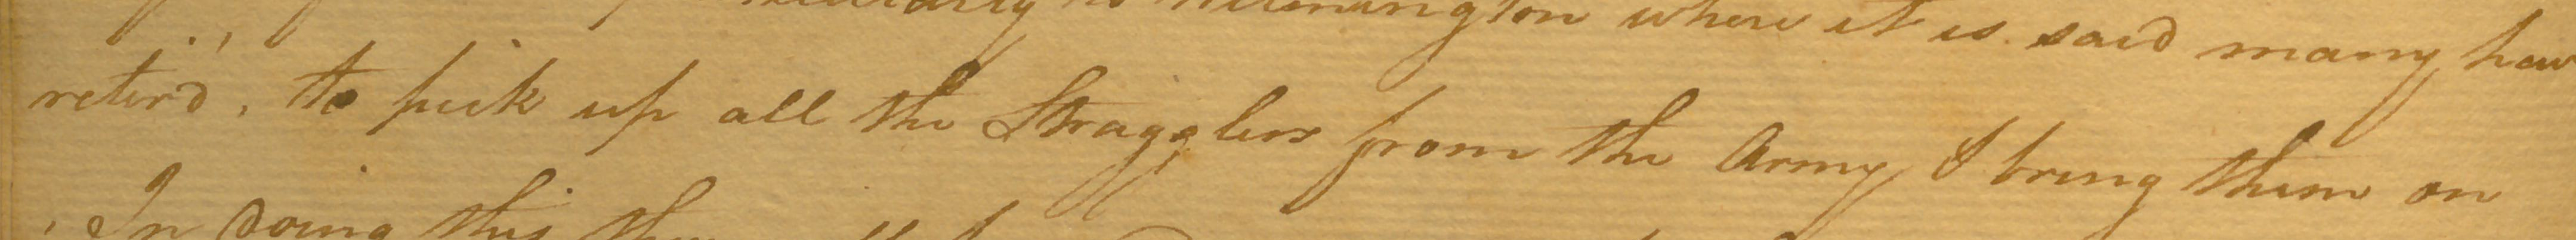retir'd, to pick up all the Stragglers from the Army & bring them on
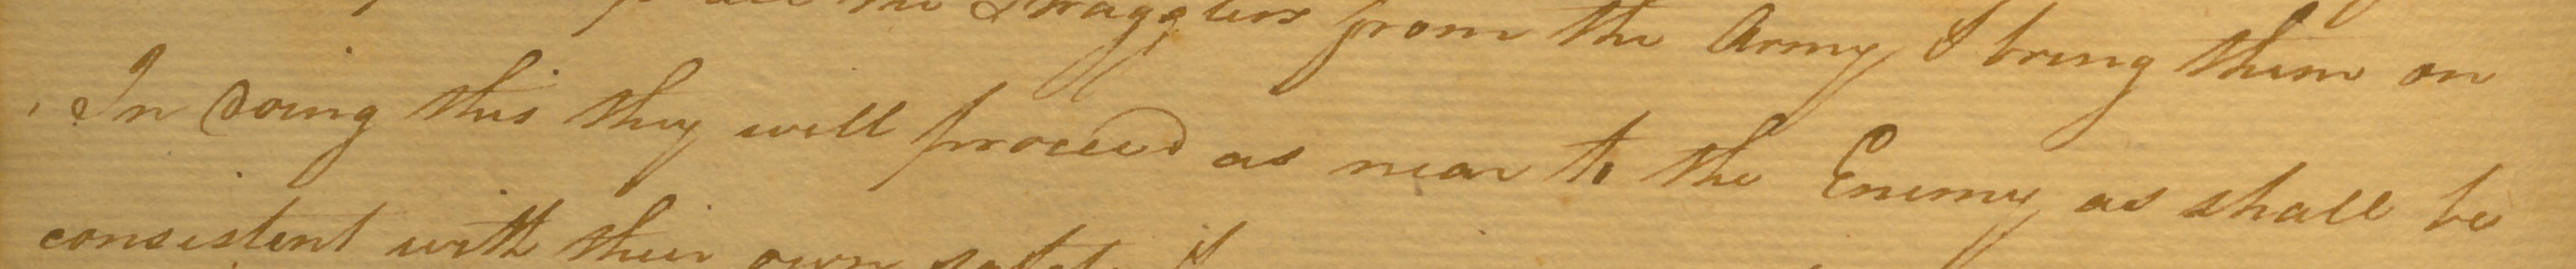In doing this they will proceed as near to the Enemy as shall be
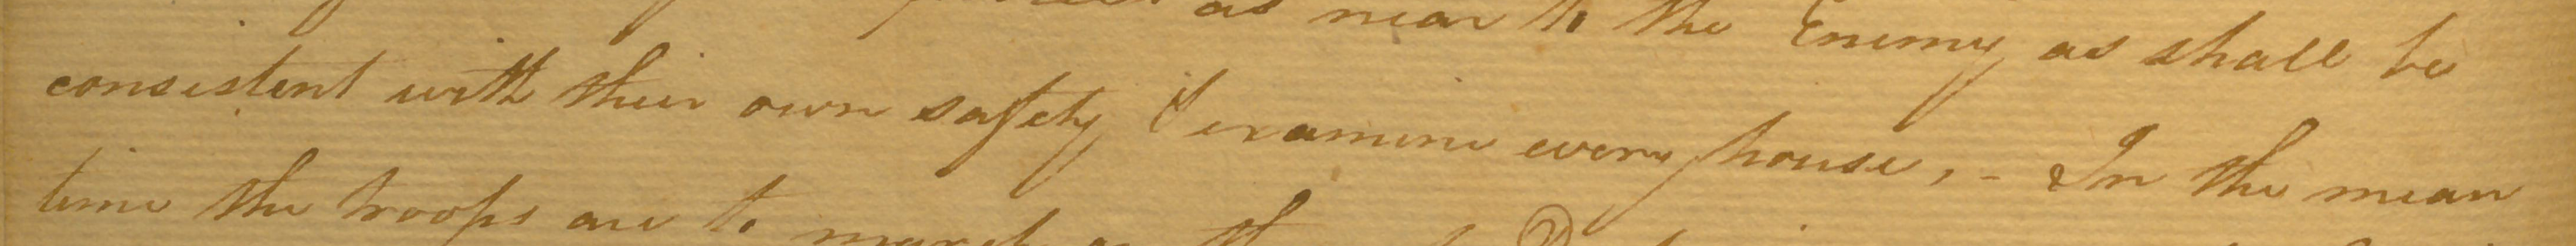consistent with their own safety, & examine every house,- In the mean
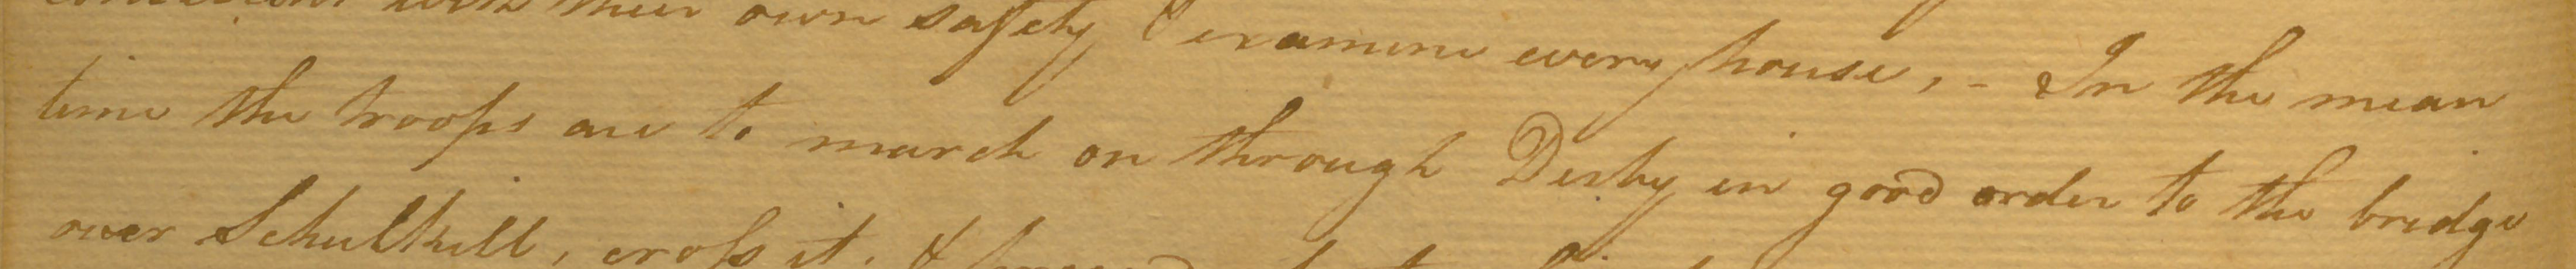time the troops are to march on through Derby in good order to the bridge
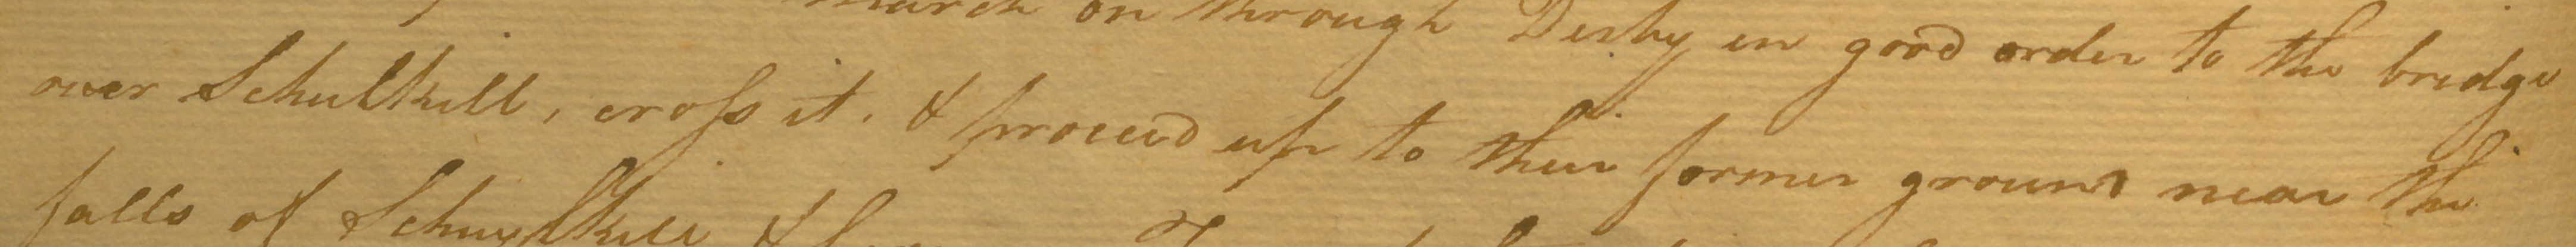over Schulkill, cross it & proceed up to their former ground near the
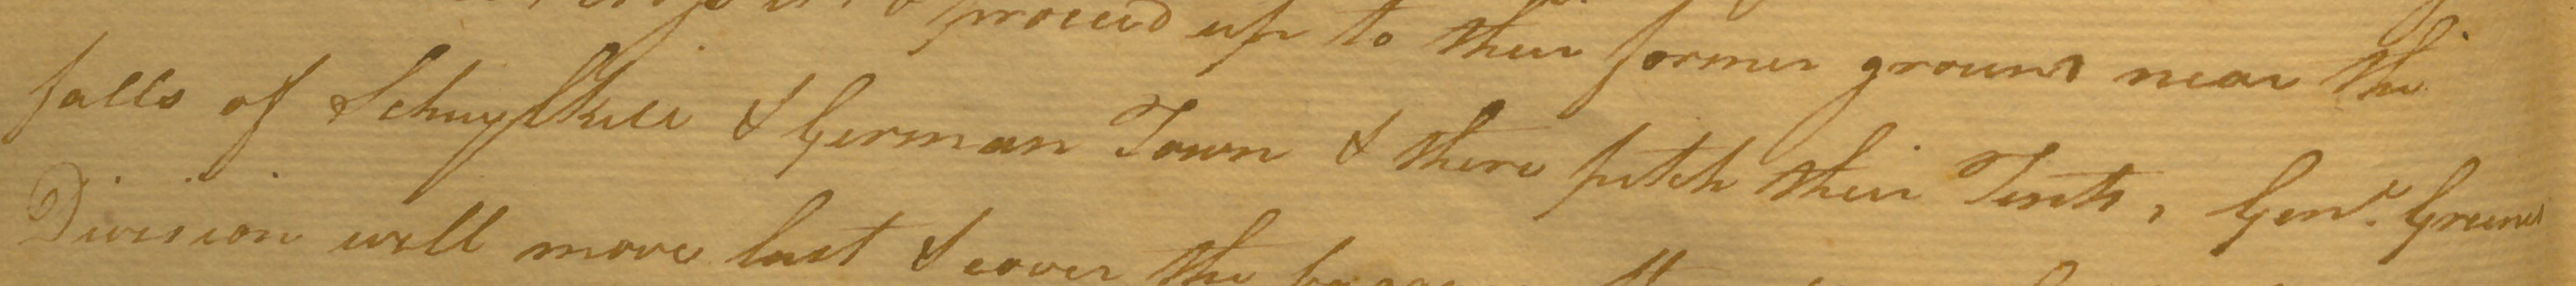falls of Schuylkill & German Town & there pitch their Tents, Gen^l. Greenes
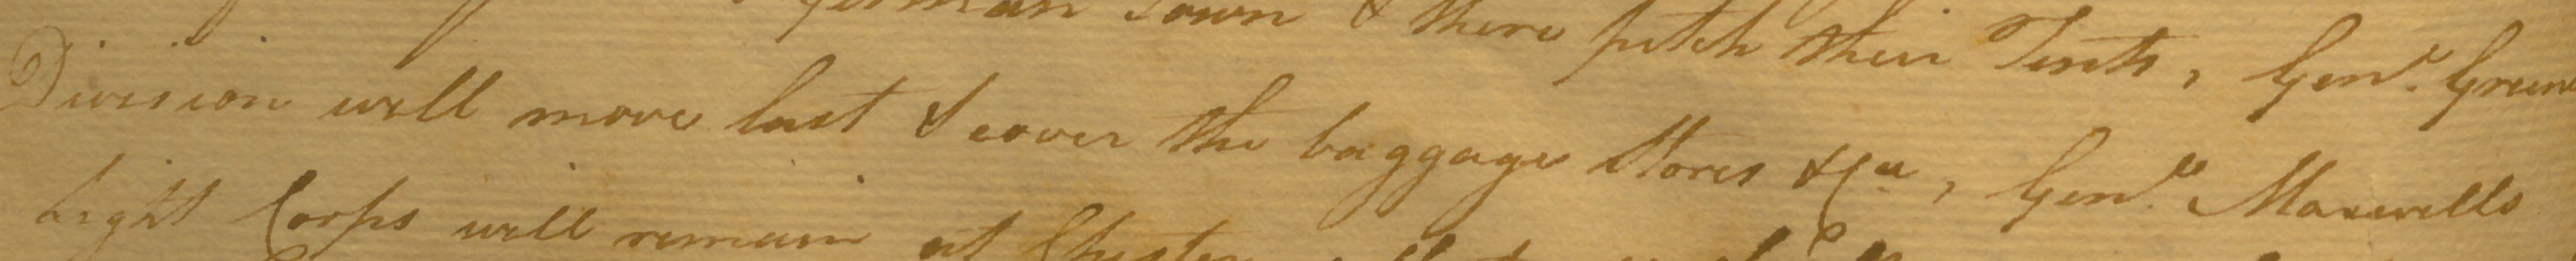Division will move last & cover the baggage Stores &c^a., Gen^l. Maxwells
